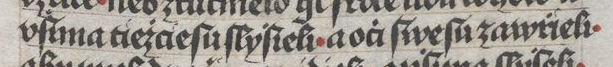vẛima tieżcie ſu ſlyẛieli.a oċi ſwe ſu zawṙieli.
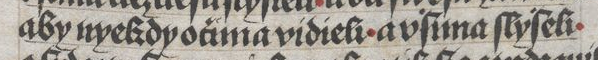aby nyekdy oċima vidieli.a vẛima ſlyẛeli.
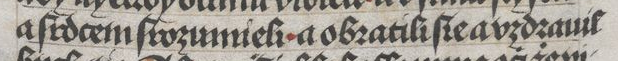a ſrdcem ſrozumieli.a obratili ſie a vzdrauil
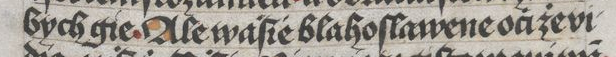bych gie.Ale waẛie blahoſlawene oci że vi¬
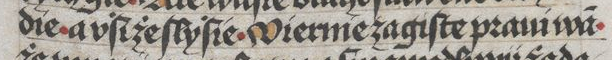die.a vẛí że ſlyẛíe.Viernie zagiſte praui wā.
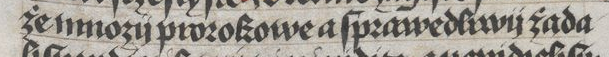że mnozij prorokowe a ſprawedliwij żada¬
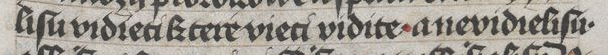li ſu vidieti které vieci vidite.a nevidieli ſu.
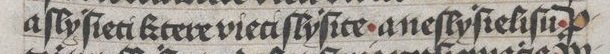a ſlyẛieti které vieci ſlyẛite.a neſlyẛieli ſu.Ꝓ¬
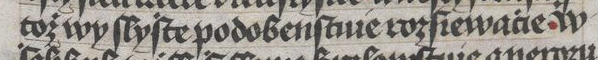toż wy ſlyẛte podobenſtwíe rozſiewaċie.W¬
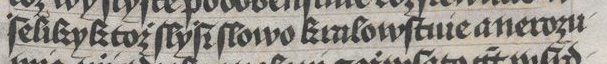ẛeliky ktoż ſlyẛi ſlowo kralowſtuie a nerozu¬
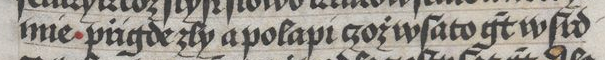mie.pṙigde zly a polapi czoż wſato ḡt w ſrd¬
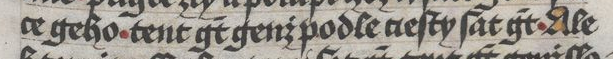ċe geho.tent ḡt genż podle cieſty ſat ḡt.Ale
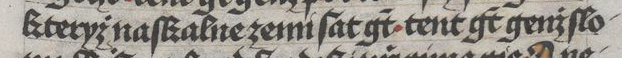kteryż naſkalne zemi ſat ḡt.tent ḡt genż ſlo¬
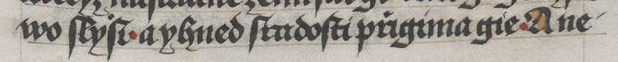wo ſlyẛi.a yhned ſradoſti přigíma gie.A ne¬
